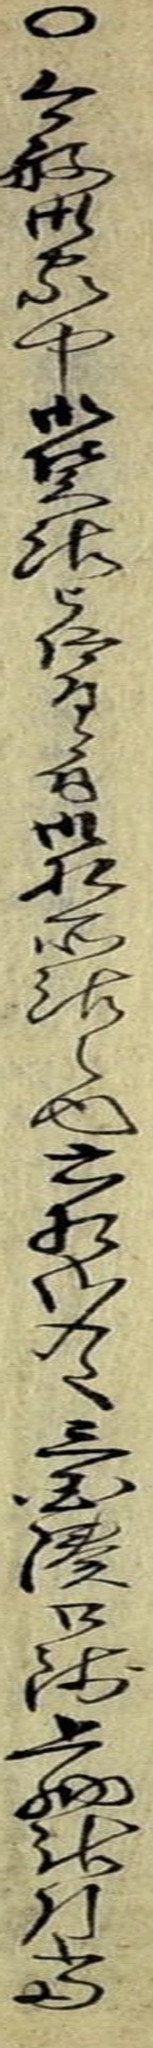〇今般御家中御貸銀被仰付候ニ付御札所銀之内六拾弐貫匁三国湊口銭上納銀引当
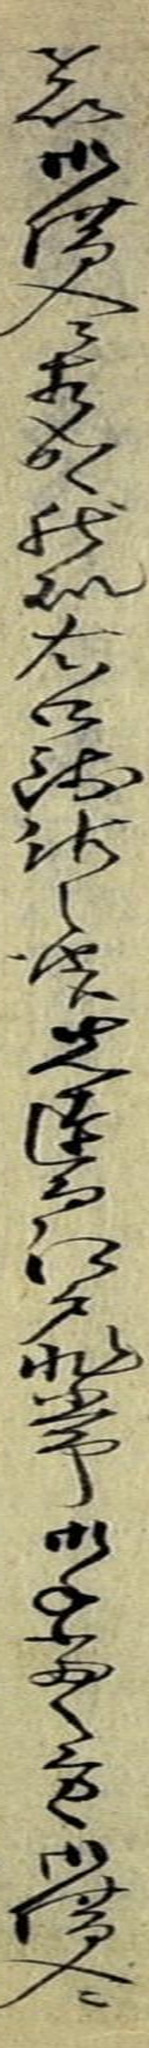を以御借入ニ相成候然処右口銭銀之儀ハ先達而江戸非常御手当之方へ御借入ニ
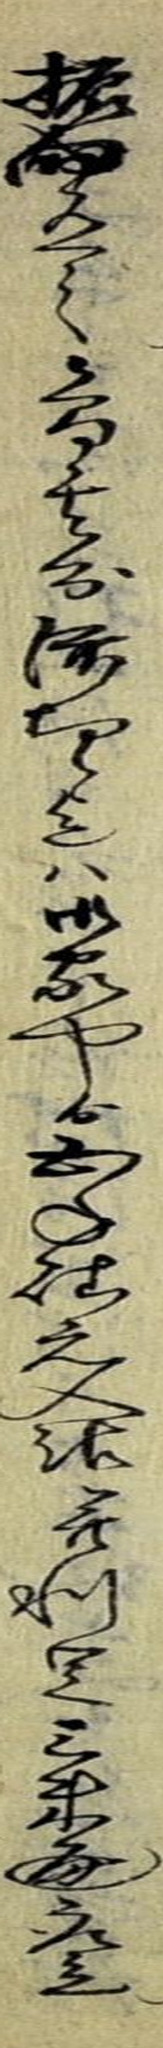振向有之候間其分済切候迄ハ御家中ゟ五年賦元入銀并利足三朱通取立
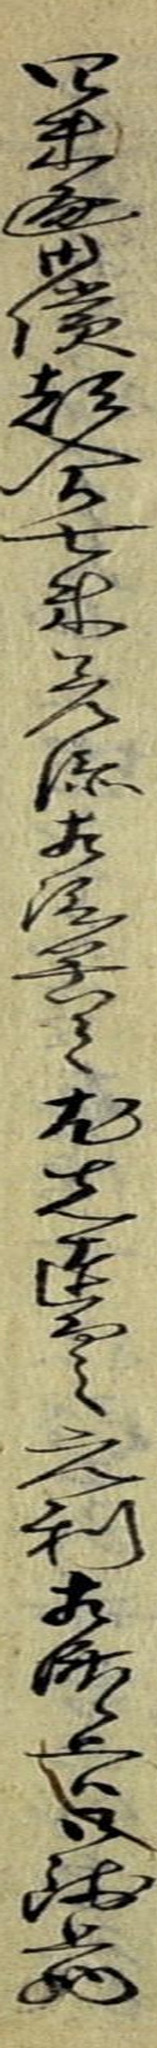四朱通御償都合七朱差添相渡筈ニ候尤先達而之元利相済候上ハ口銭上納
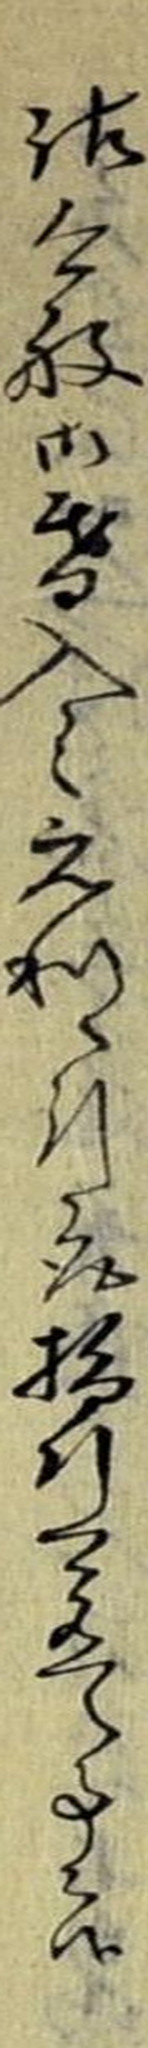銀今般御替入之元利へ引取指引可有之事ニ候
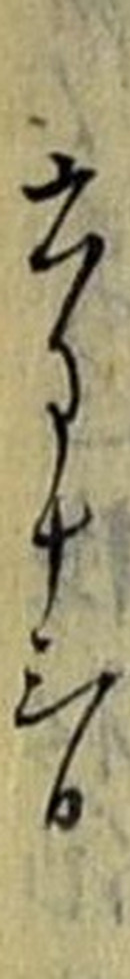六月十三日
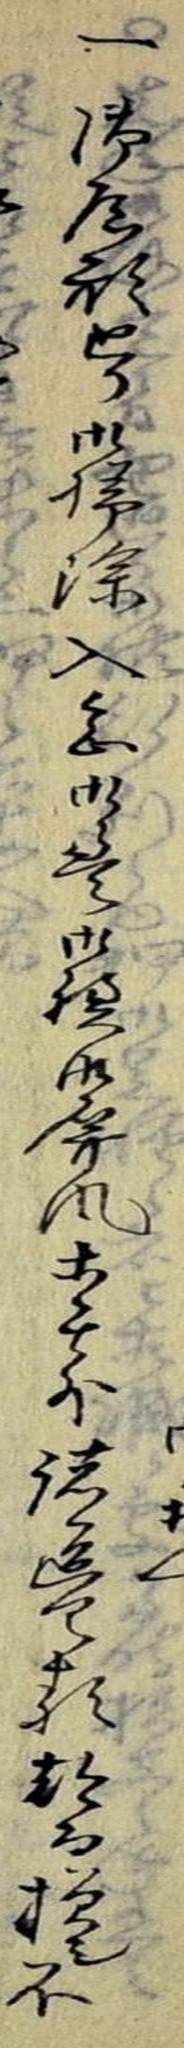一御屋形廻り御掃除入念御畳御襖御屏風等其外諸道具類都而損シ不
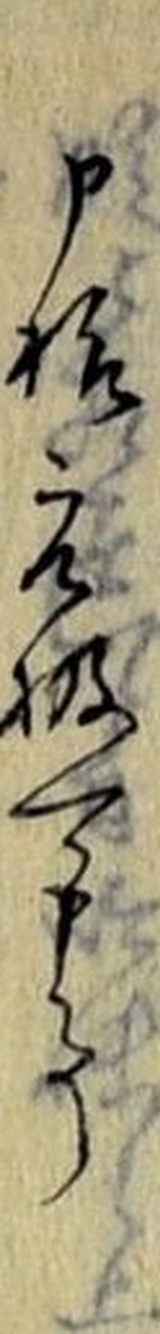申様取扱可申事
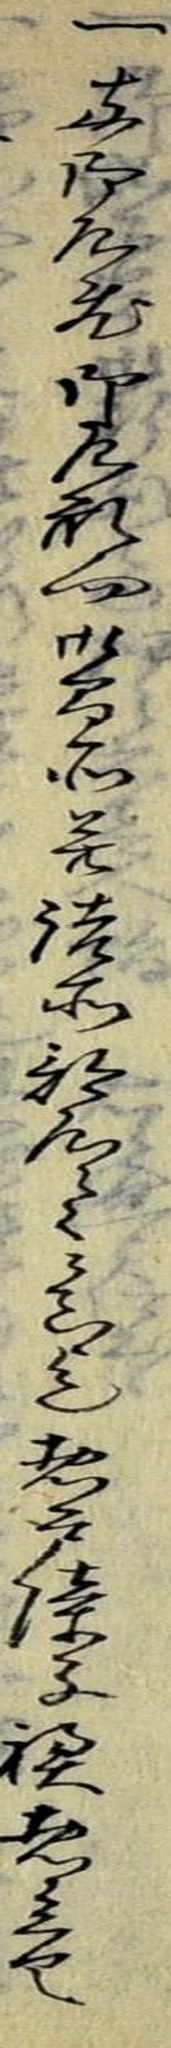一両御屋敷御屋形向御間所并詰所部屋々々ニ至迄惣戸障子襖惣立具
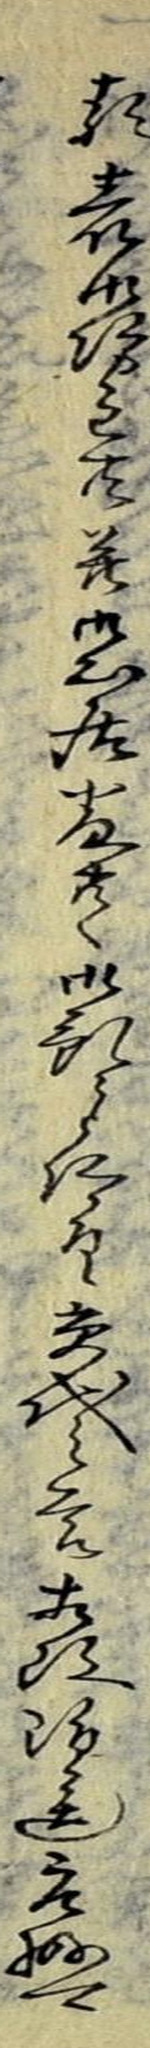類表御坊主共并御出居番共へ御預ニ被仰付候交代之節相改付送取扱可
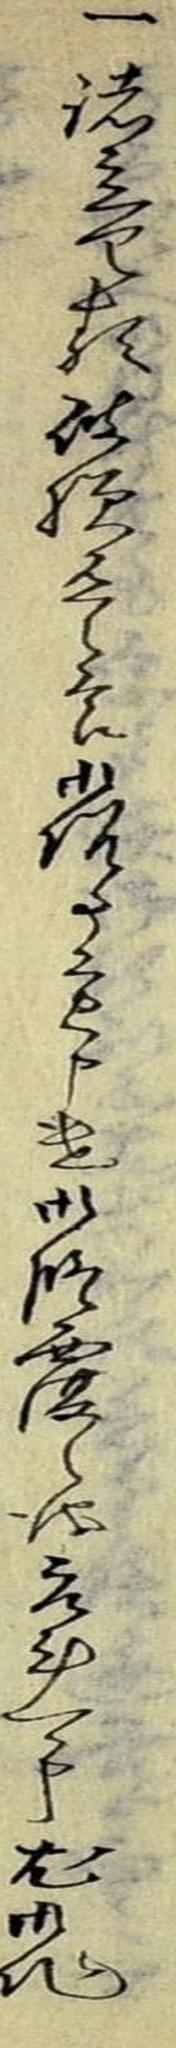一諸立具類破損有之節御作事方へ申遣御修覆之儀取計可申尤御作
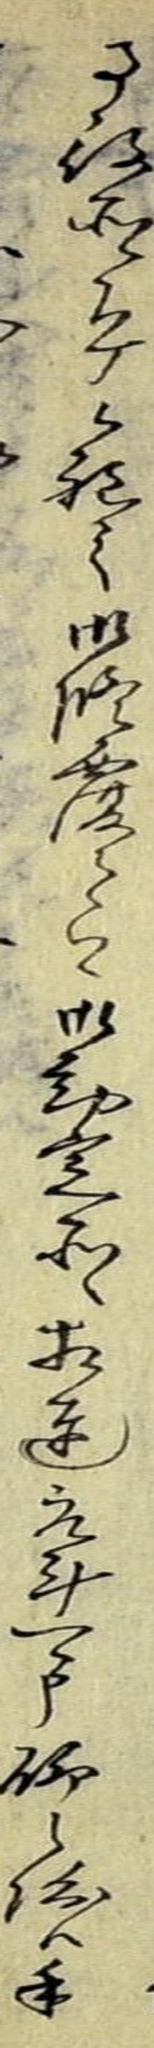事役所へ下ケ候程之御修覆ニ候ハヽ御勘定所へ相達取計可申聊之儀ハ手
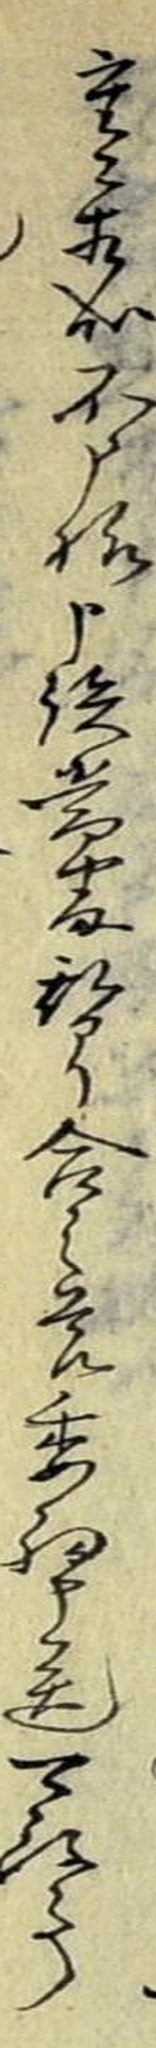重ニ相成不申様申談当番替り合之節委細申送可致事
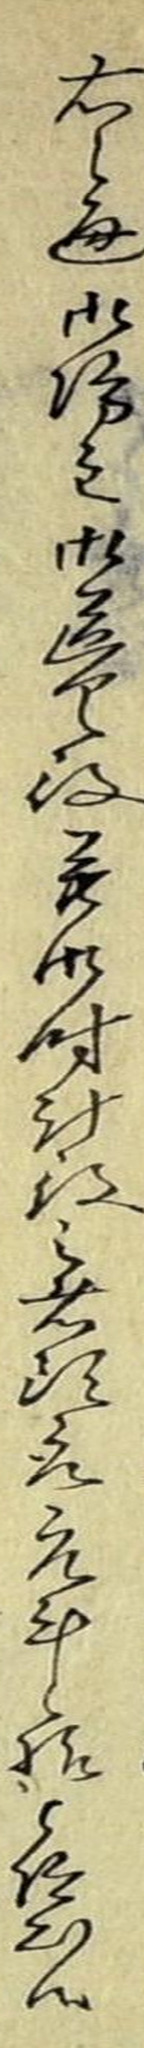右之通御坊主御道具役并御時計役之者頭取取計候様被仰出候
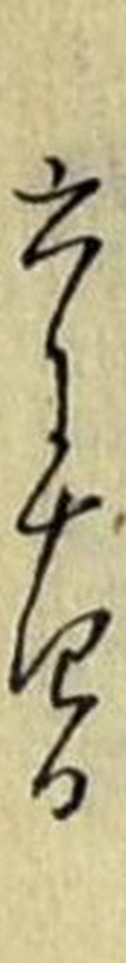六月十四日

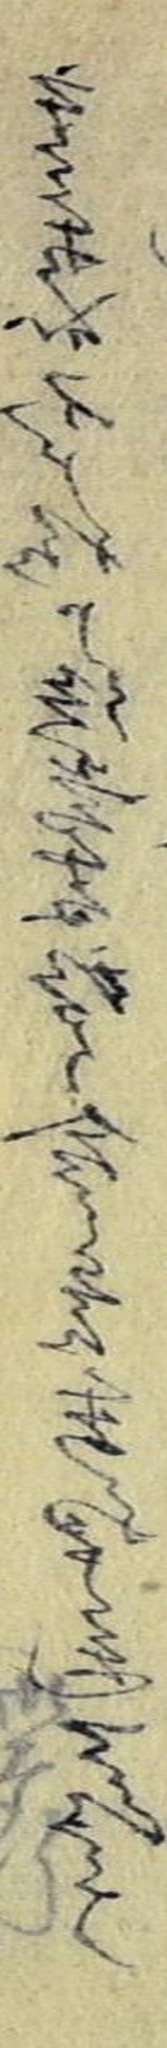七月廿一日
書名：命令之部 三
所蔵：福井県文書館 Fukui Prefectural Archives
